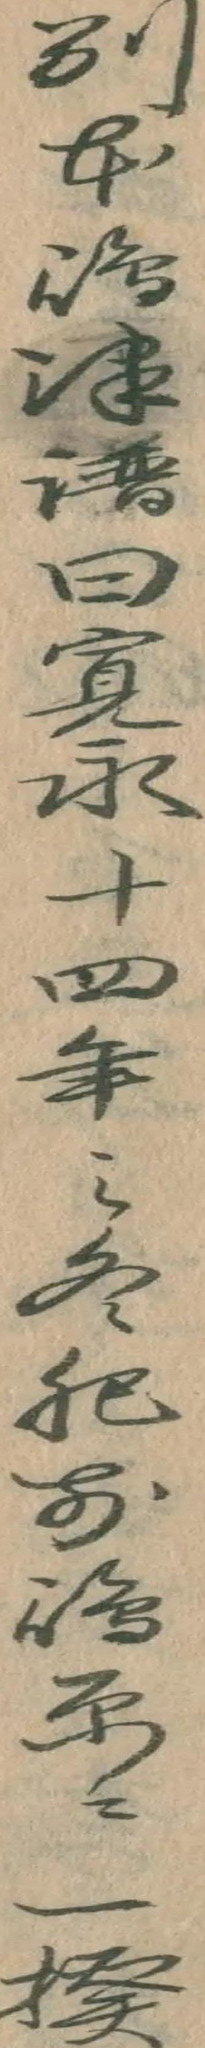別本島津譜曰寛永十四年之冬肥前島原に一揆
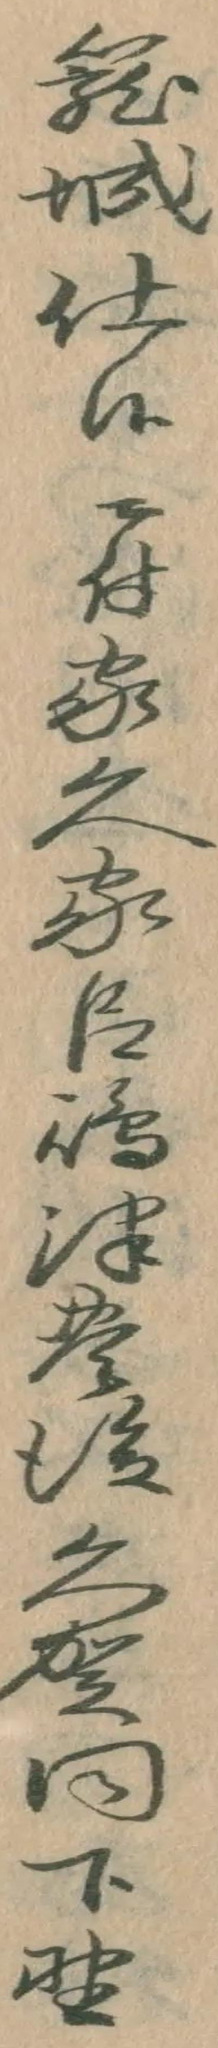籠城仕候に付家久家臣島津豊後久賀同下野
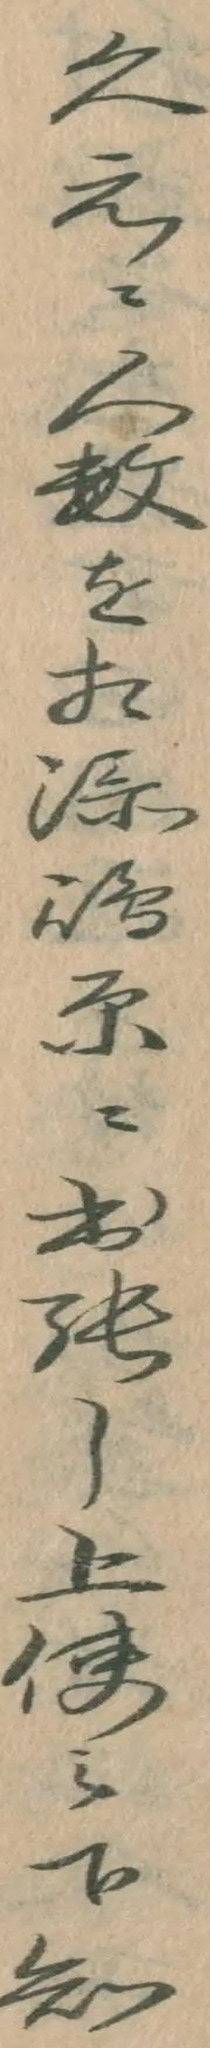久元に人数を相添島原に出張し上使之下知
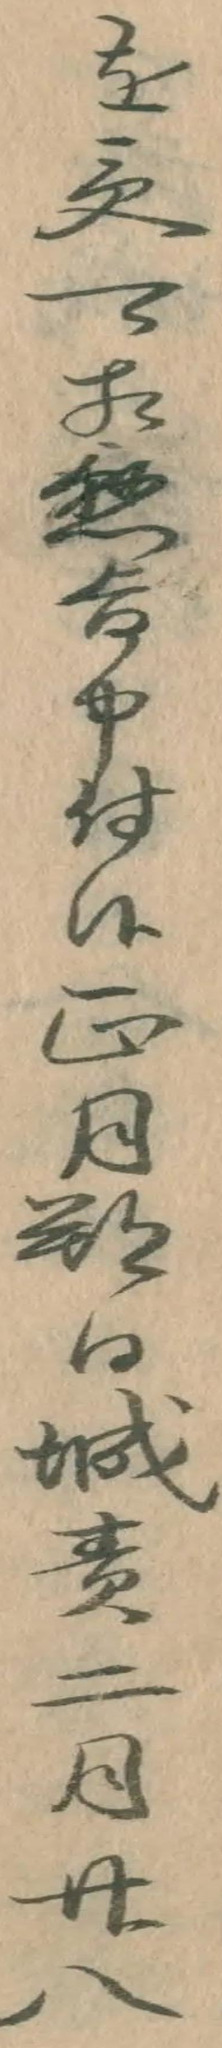を受可相懸旨申付候正月朔日城責二月廿八

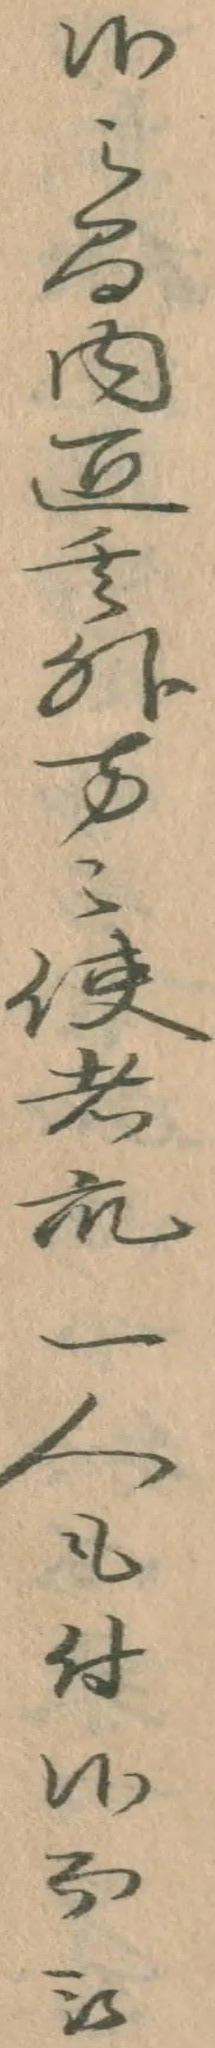候之間内匠其外方之使者衆一人も付候而被
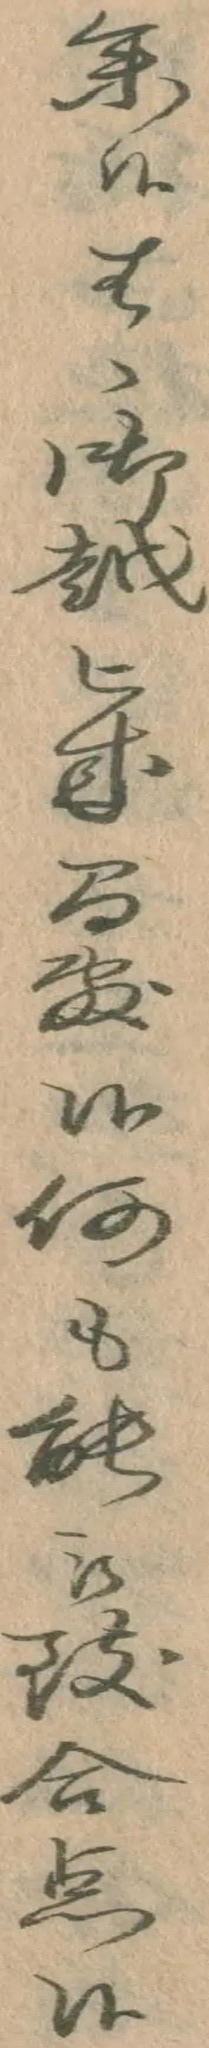参候者々御越被成間敷候何も能被致合点候
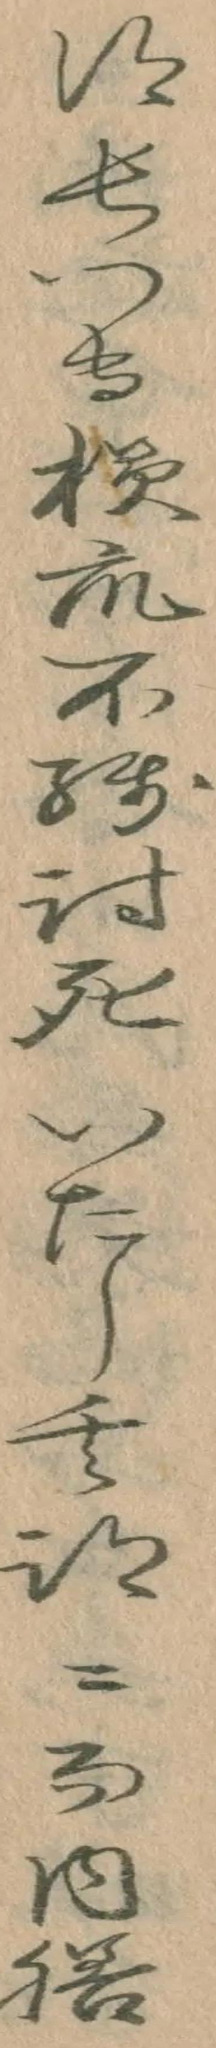得長門守様衆不残討死いたし其跡に而内膳
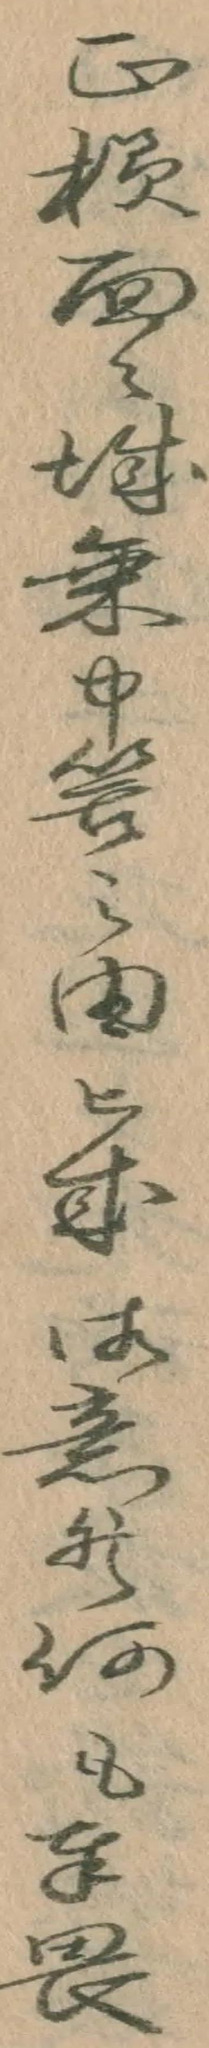正様面々城乗申筈之由被成御意候何も奉畏
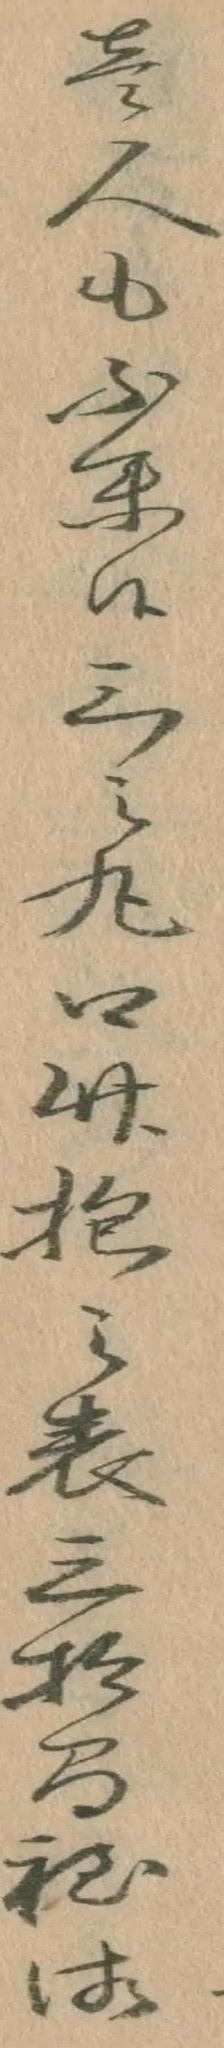壱人もふ参候三之丸口竹把之表三拾間程御
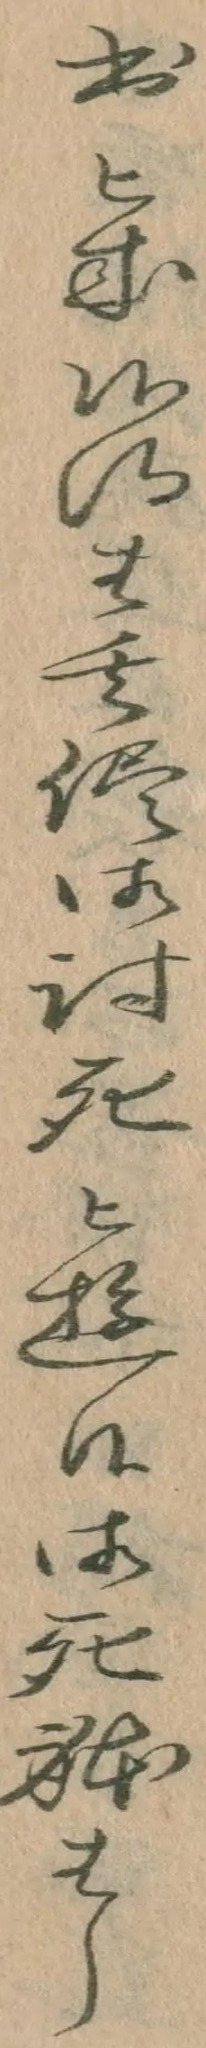出被成候得者其侭御討死被遊候御死躰者し
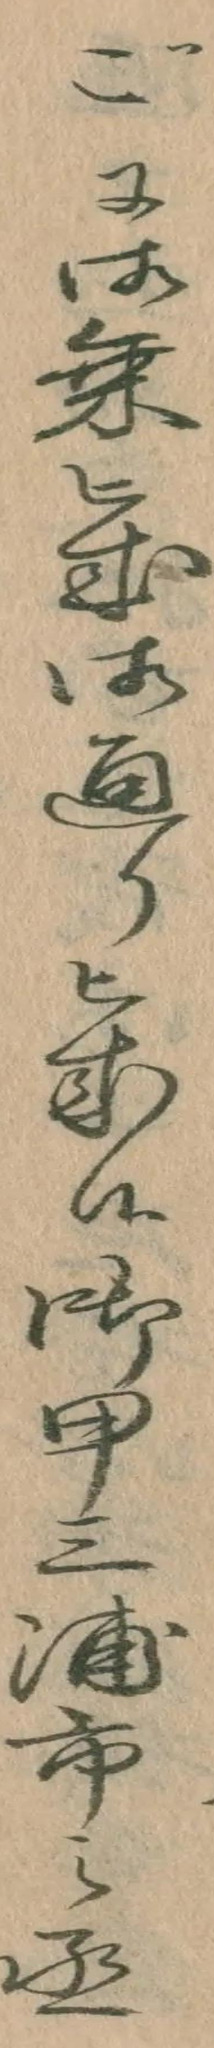ご尓御乗被成御通り被成候御甲三浦市之丞
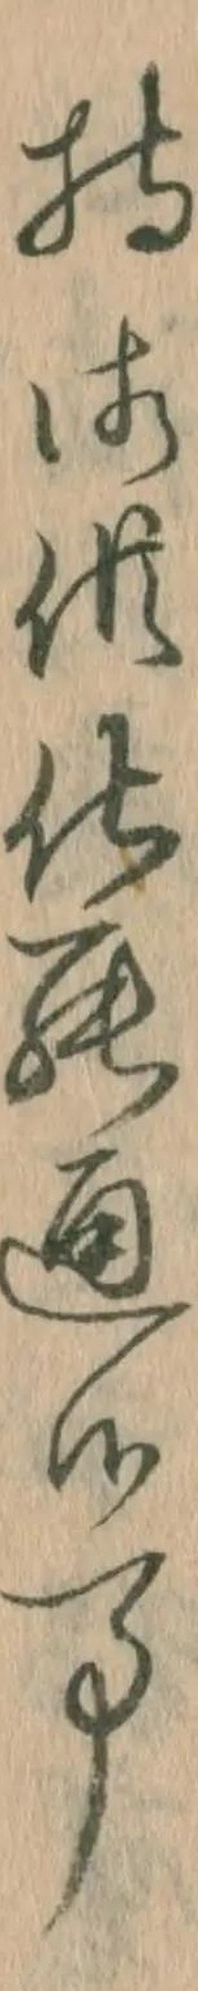持御供仕罷通候事
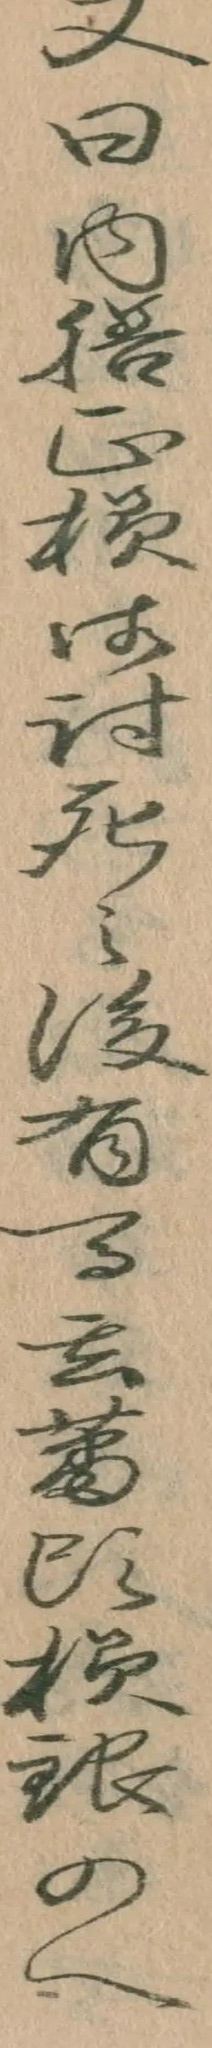又曰内膳正様御討死之後有馬玄蕃頭様銀のへ
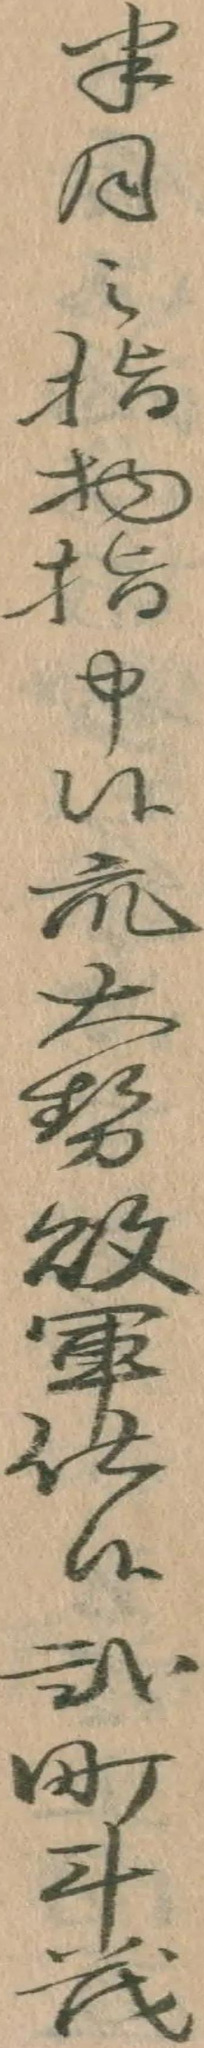半月之指物指申候衆大勢敗軍仕候弐町斗茂
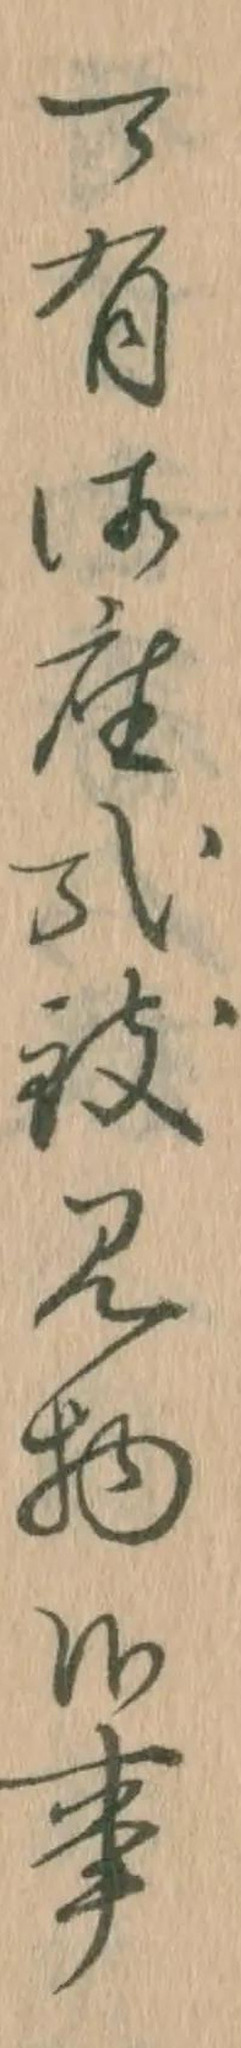可有御座哉致見物候事
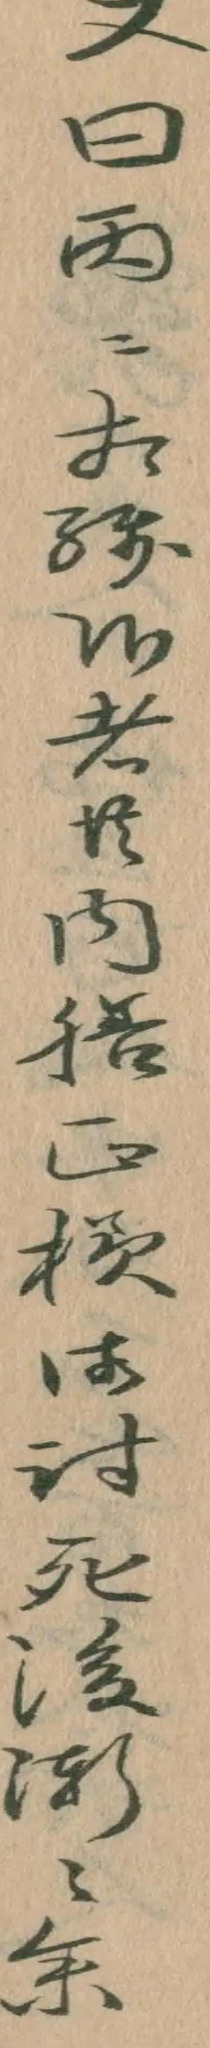又曰丙に相残候者共内膳正様御討死後漸に参
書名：切支丹御退治記 49巻. [5]
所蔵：国立国会図書館 National Diet Library, JAPAN
